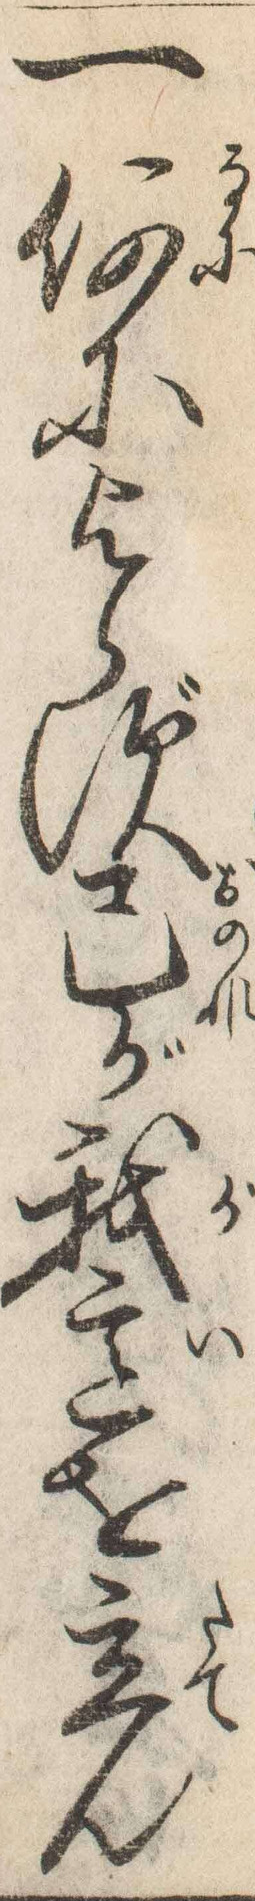一何によらず己が我意を立ん
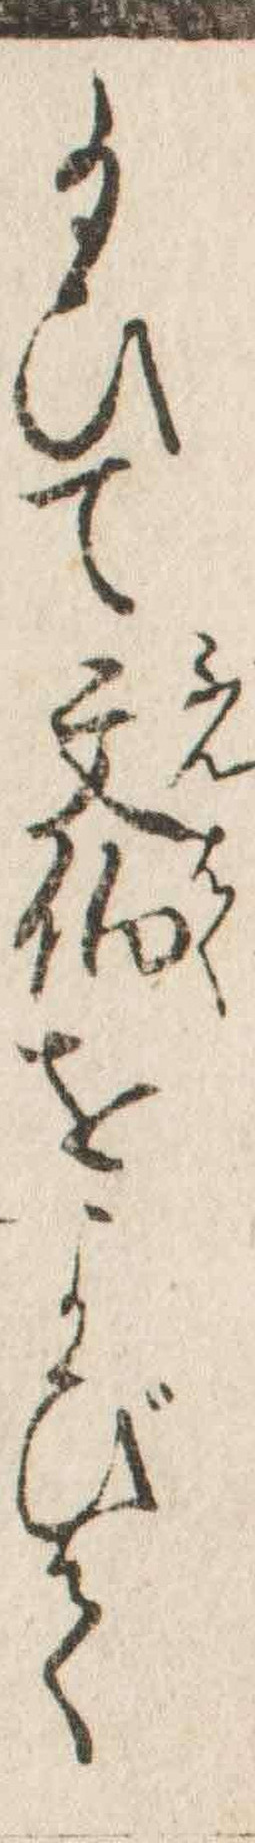給ひて文伯をよびて
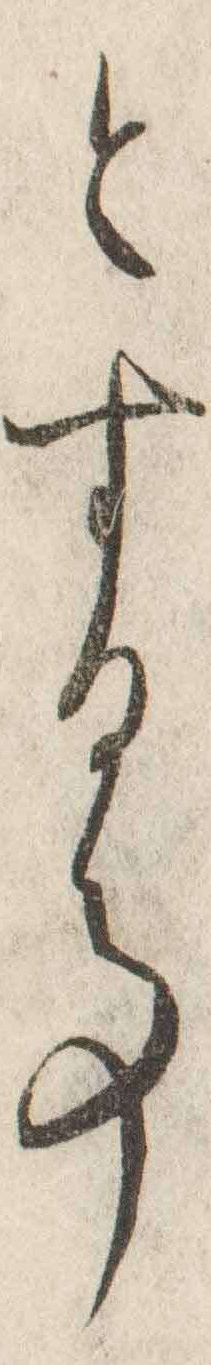とする事
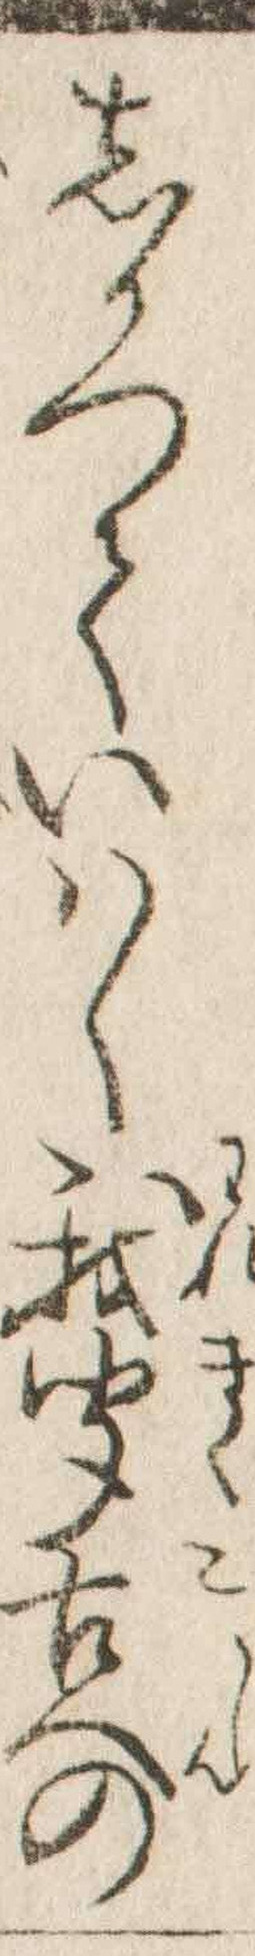しかつていはく我聞古人の
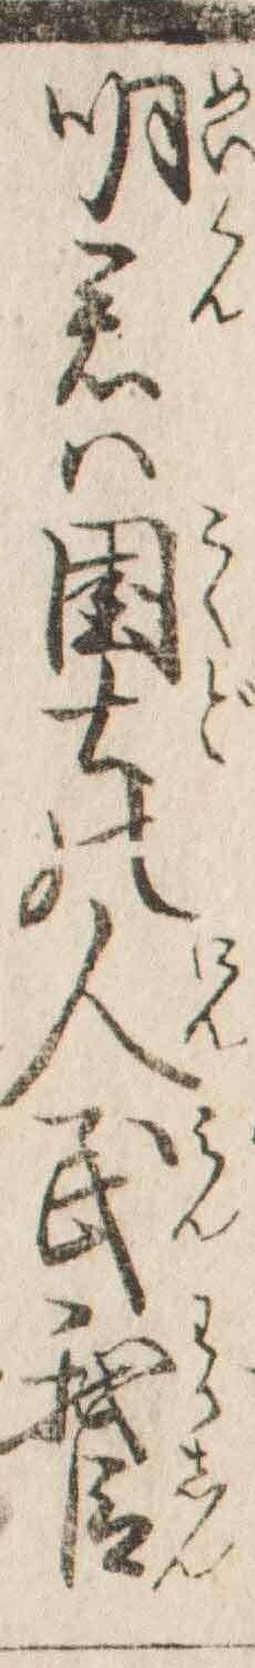明君は国土の人民我臣
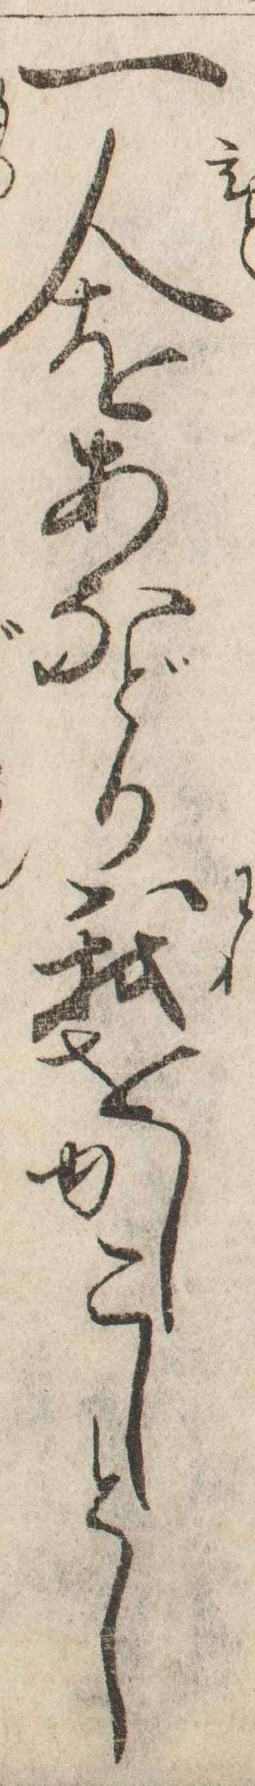一人をあなどり我をかしこしとし
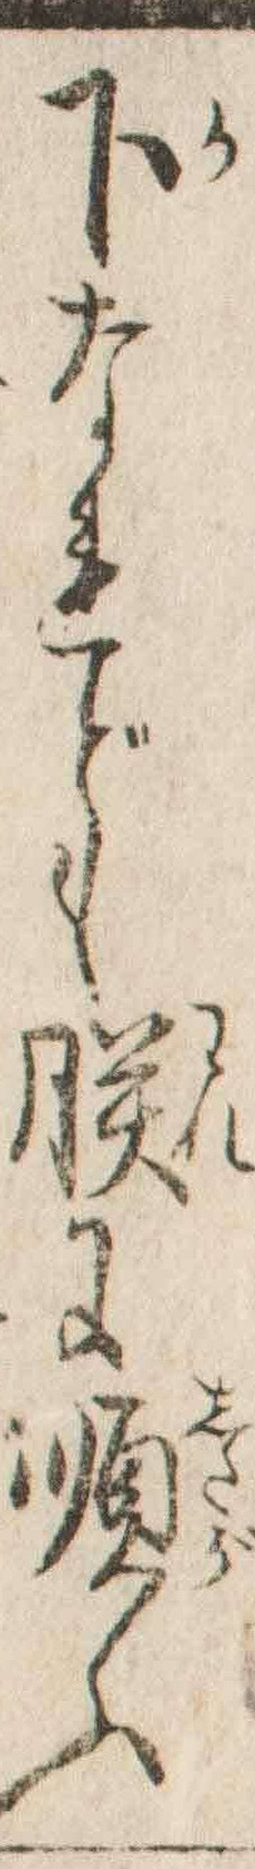下なれども朕に順ふ
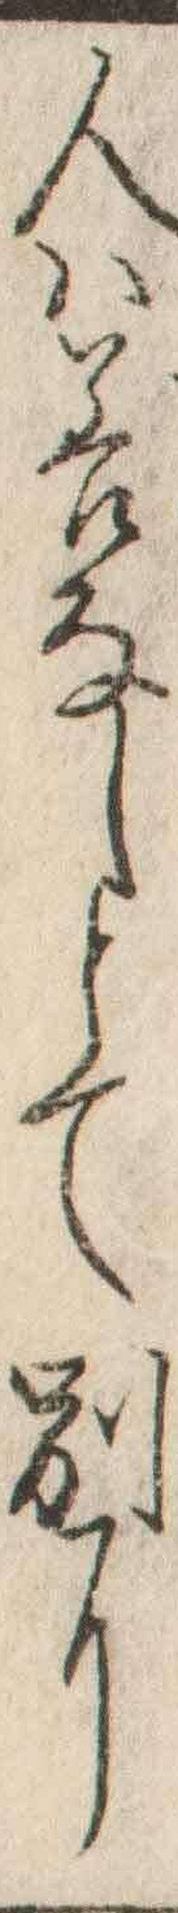人は善なしとて別に
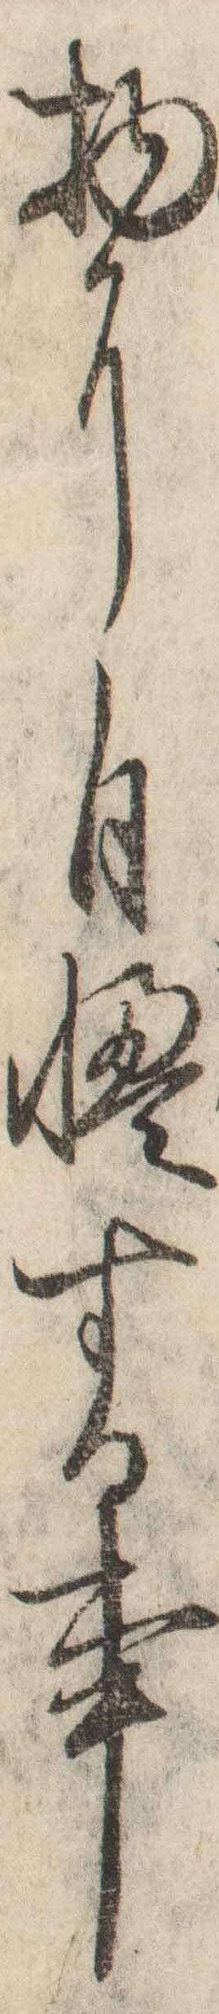物に自慢する事

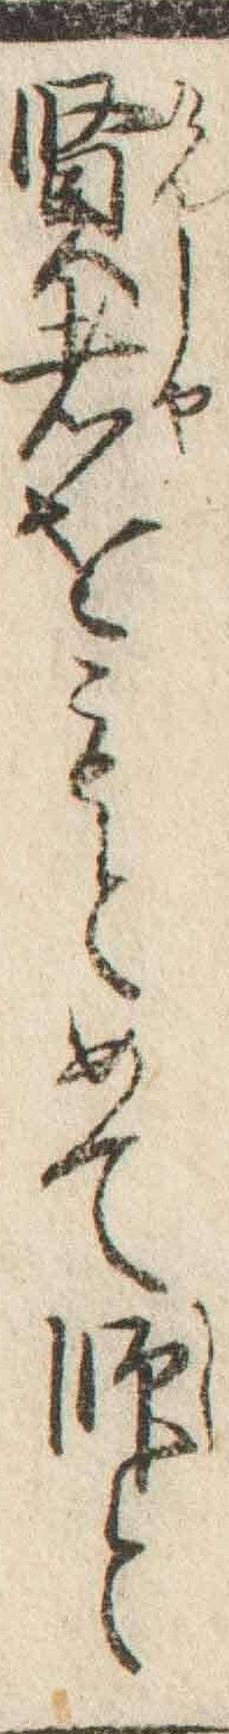賢者をもとめて師と
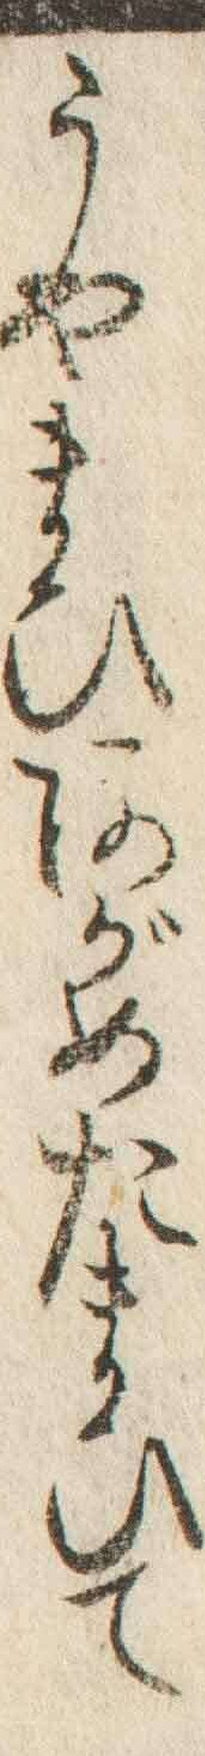うやまひあがめたまひて
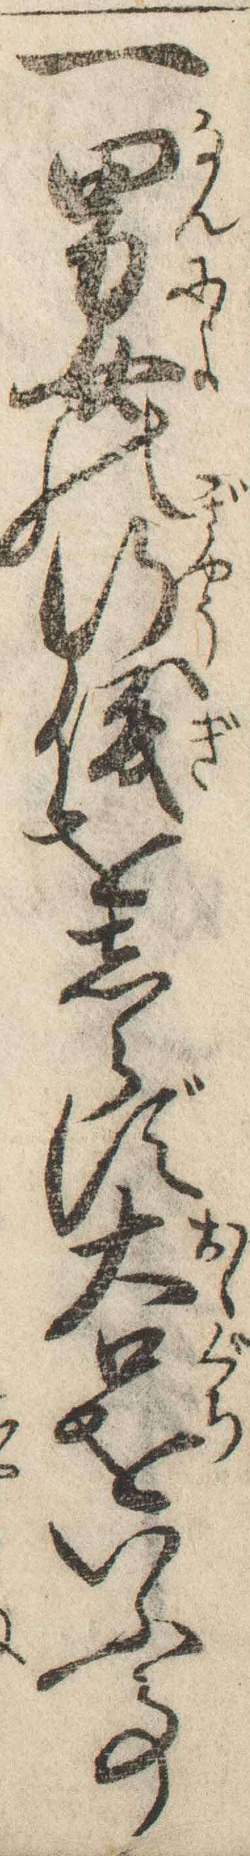一男女の行儀をしらず大口をいふ事
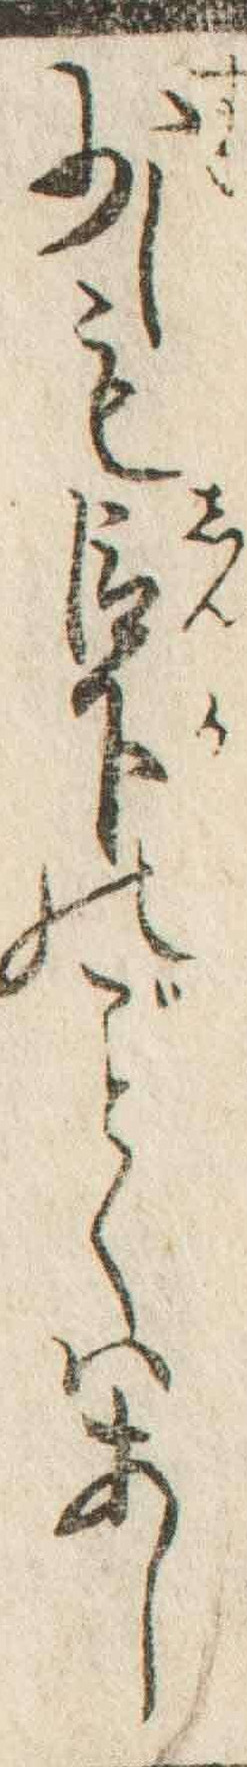少しも臣下のごとくはあし
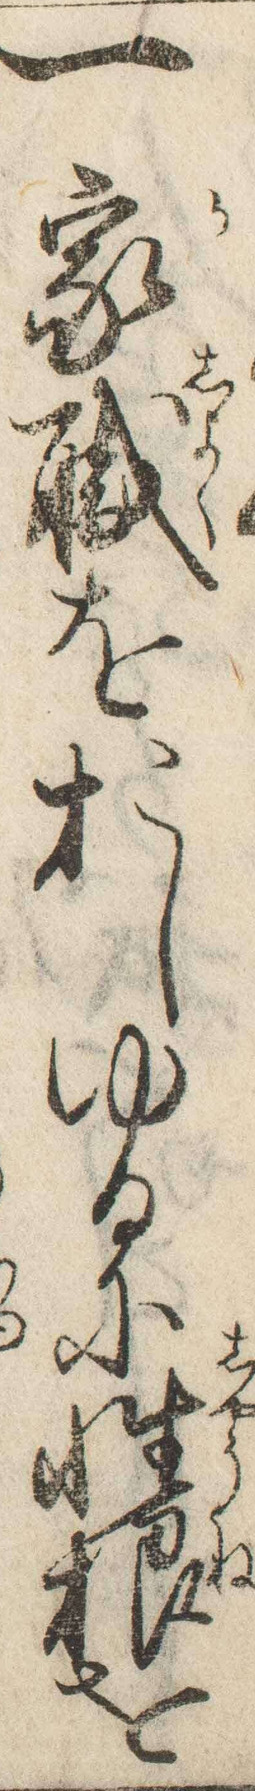一家職をおしゆるに性根を
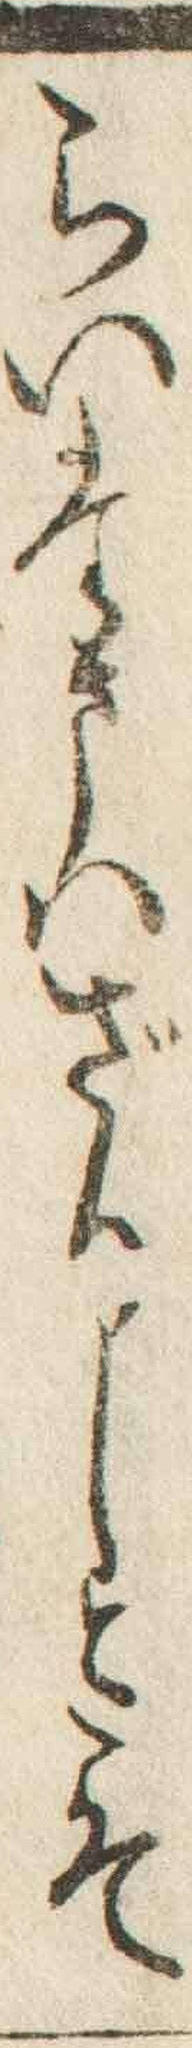らいたまはざりしとこそ
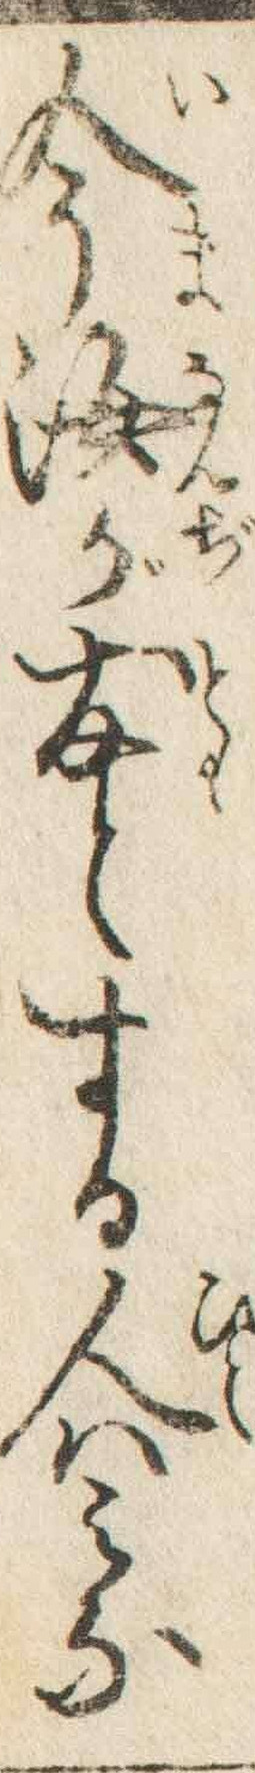今汝が友とする人はみな
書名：撫育草
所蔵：東京学芸大学附属図書館 国文学研究資料館
